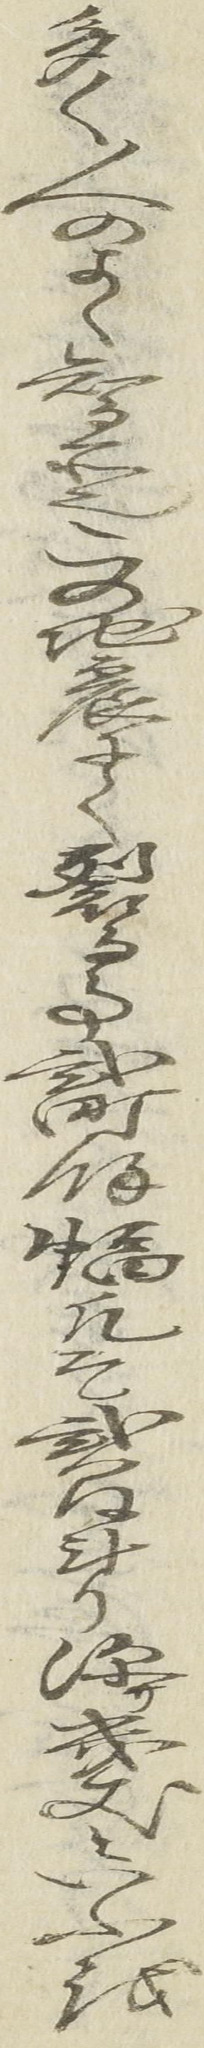多く人のよく知る所也この地震にて裂る事弐町余幅凡そ弐間斗り深サ幾丈といふを
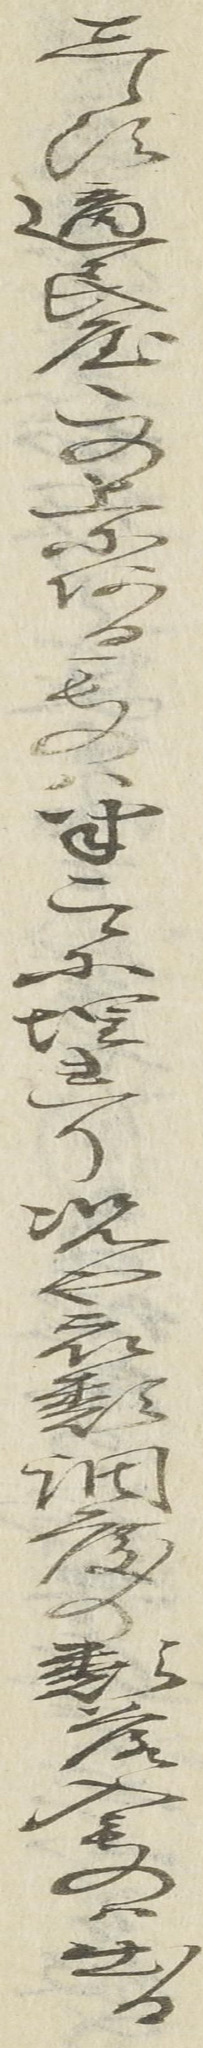しらす適民屋この上にあるものハ半こゝに埋れり況や衣類調度の類落入ものハ出る
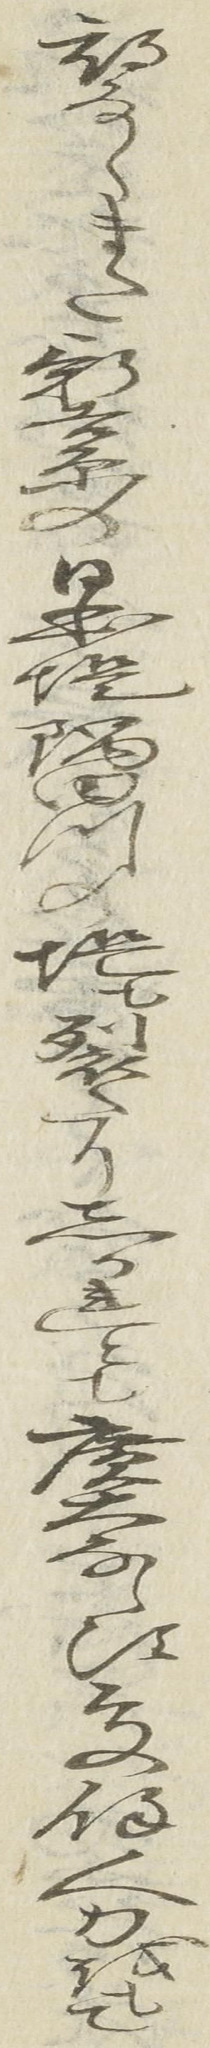？なくまた新吉原の日本堤隅田川の堤も裂たりしかれとも広大ならすその余人力をもて
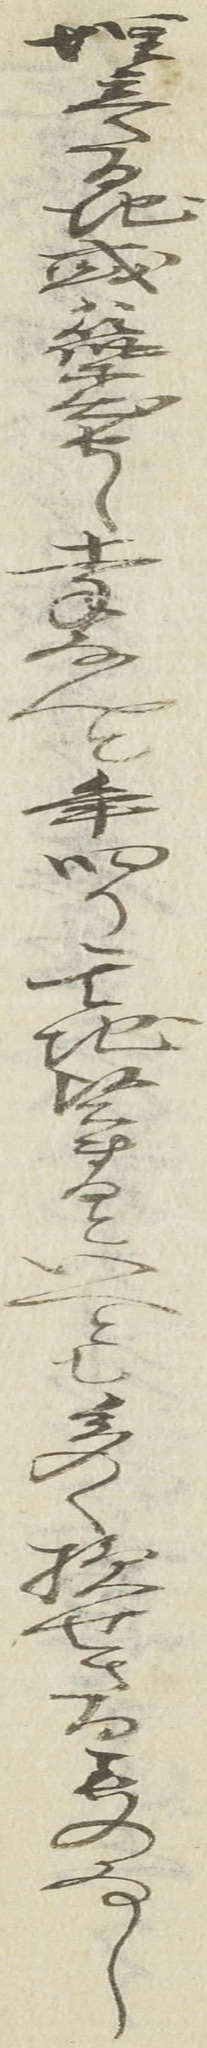埋みたる地或ハ築出セり土手なんと年旧り天地堅まるといへとも多く損せさるものなし
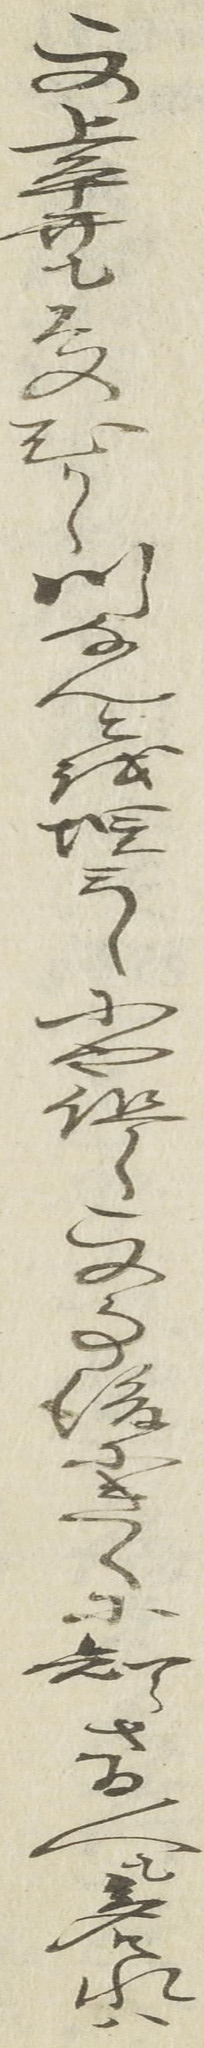この上平井もそのむかし川なんとを埋ミしにや但しこの事後にきくに知らさる人も多ケれハ
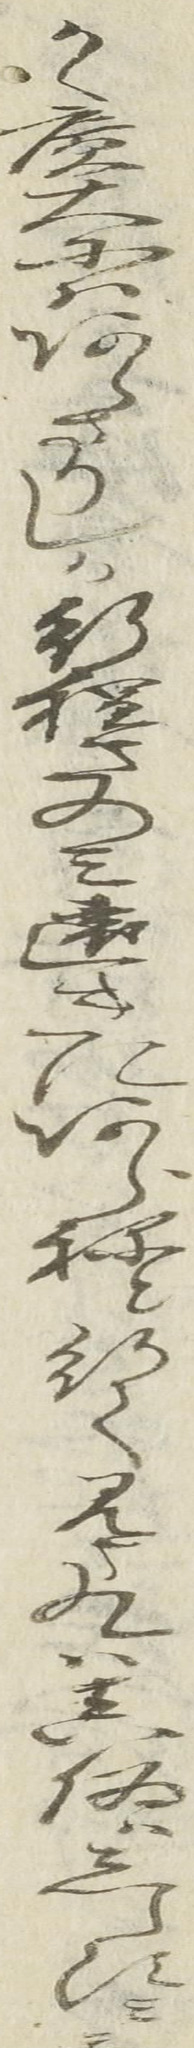かく広大にハあらさりしか行程さのミ遠きにあらねと行て見されハ真偽ハしらす云云
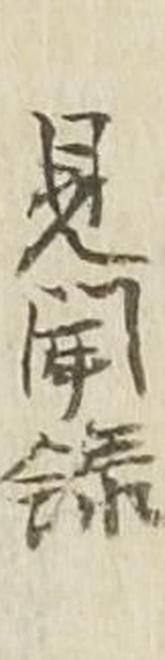見聞録
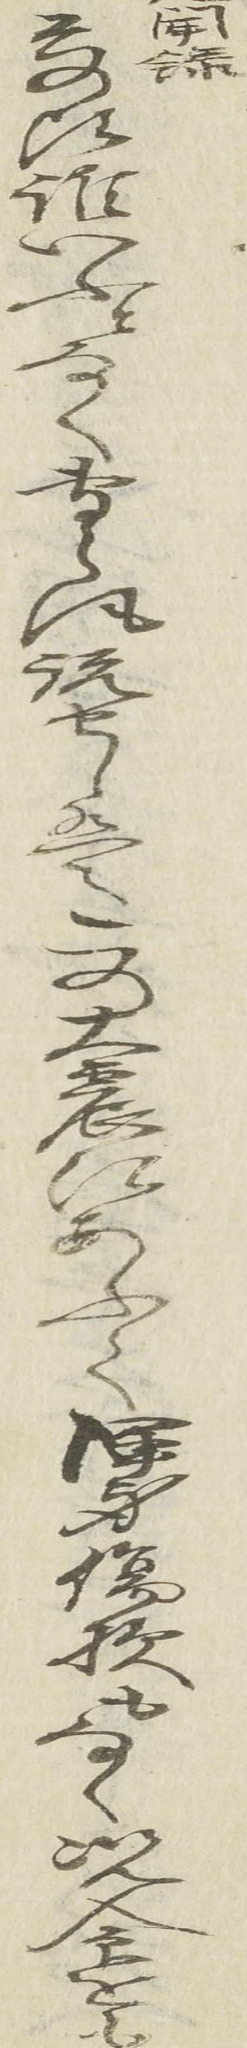一そのころ誰いふとなく専ら風説セしはこの大震にあふて渾身傷損もなく況命をも
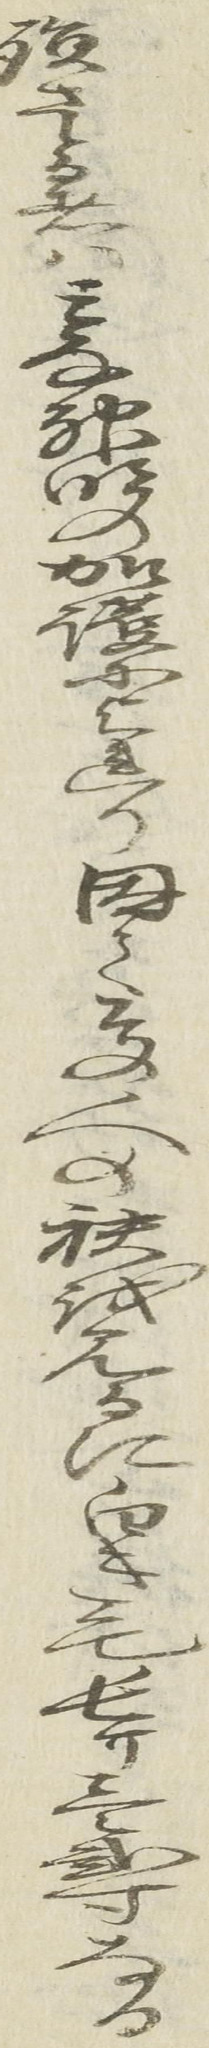殞さゝるものハミな神明の加護によれり因てその人の袂を見るに白き毛長サ壱弐寸なる
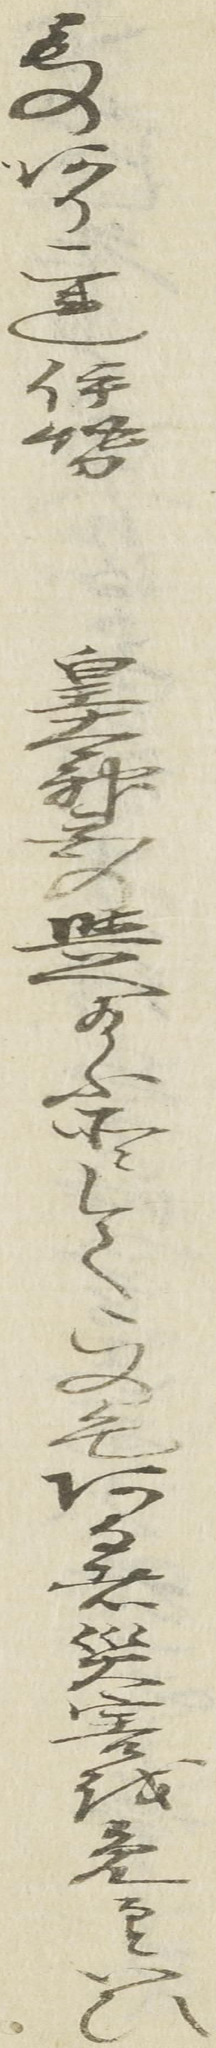ものありこれ伊勢皇大神宮の與へ給ふ所にしてこの毛ある者災害を免るといひ
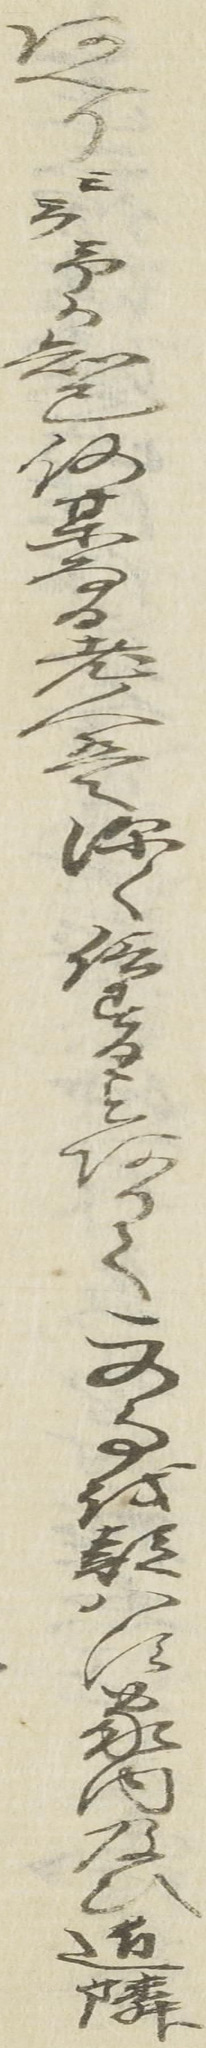あへり云云予か知己何某なる老人は深く信することありてこの事を疑はす家内及ひ近隣
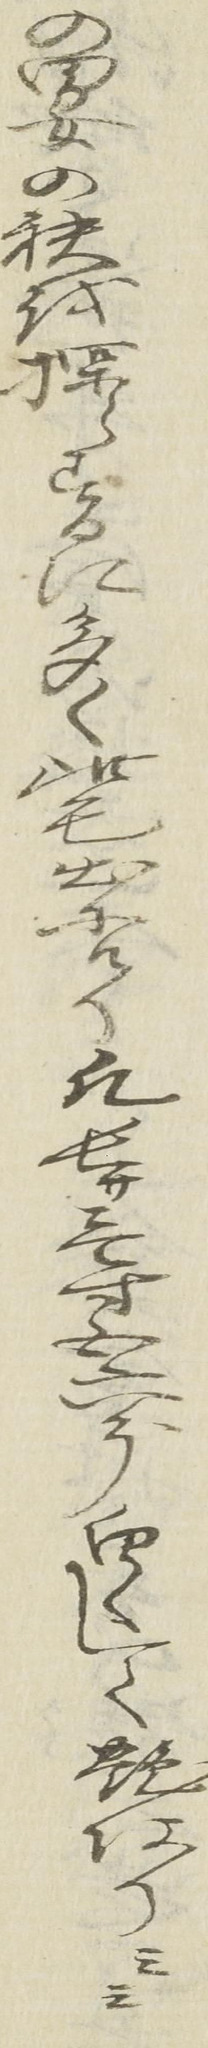の男女の袂を探らするに多く此毛出にケり凡長サ壱寸五六分白くして艶あり云云
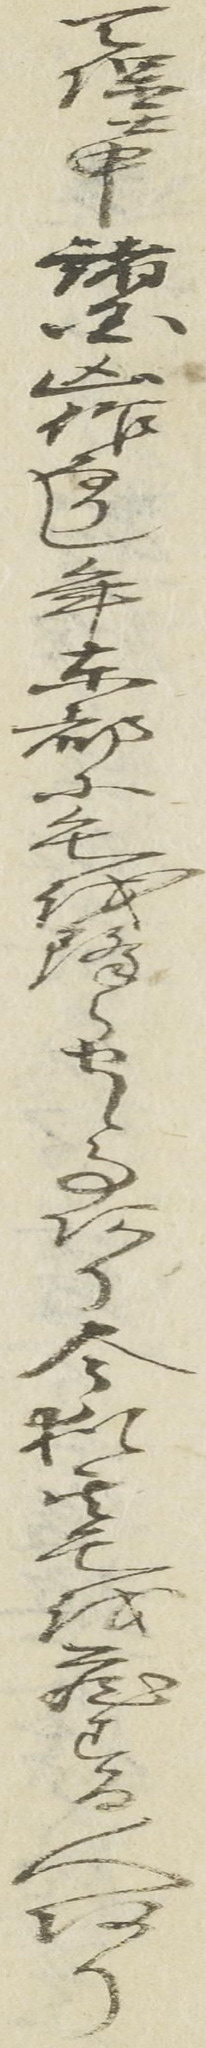天保壬申諸国凶作なりし年東都に毛を降らセし事あり今猶其毛を蔵する人あり
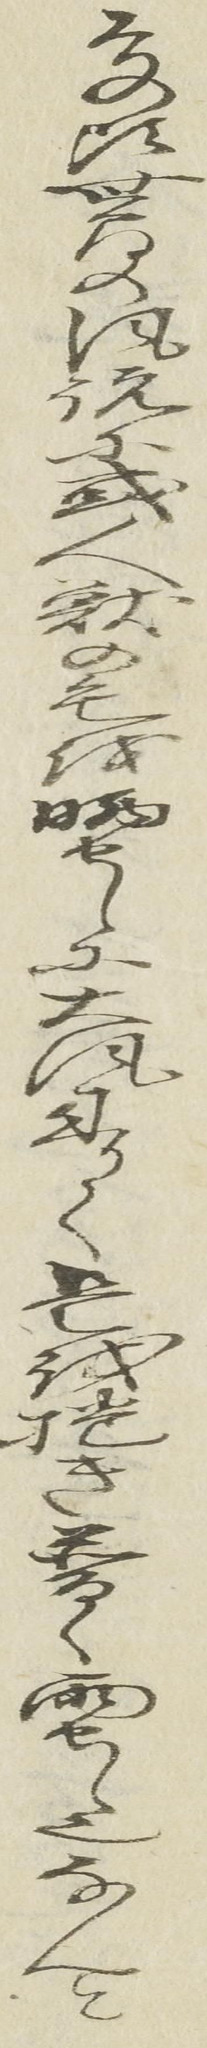その頃世間の風説に或人獣の毛を晒セしに大風来りて是を捲き普く雨セし也なんと
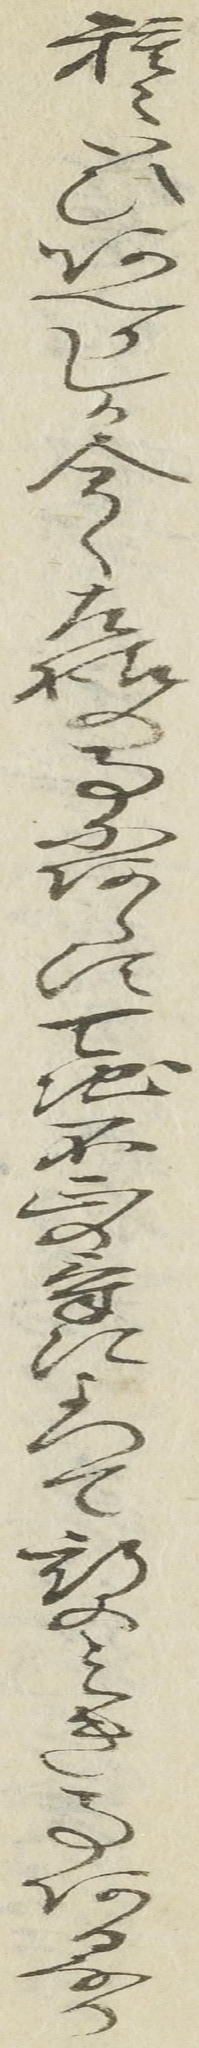種〻いひあへりしか全く左様の事にあらす天地不正の気によつて斯のことき事あるなり
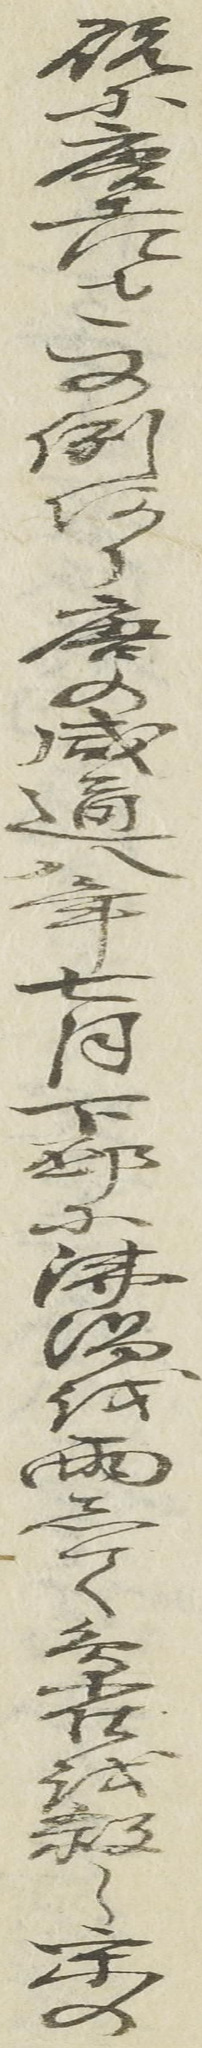既に唐土にもこの例あり唐の咸通八年七月下邳に沸湯を雨して鳥雀を殺し宋の
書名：安政乙卯江戸大地震筆記　安政丙辰八月大阪大雷雨之記追加　安政三辰年七月松前辺大地震并八月大風雨記録
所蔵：東京大学地震研究所図書室 Earthquake Research Institute Library, The University of Tokyo, JAPAN
